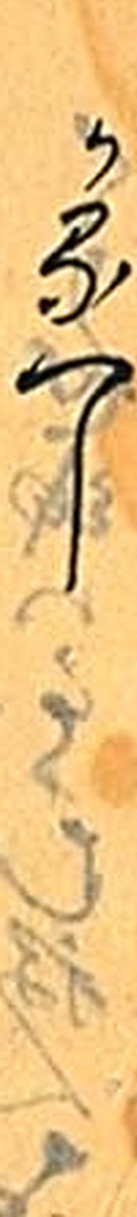かるへし
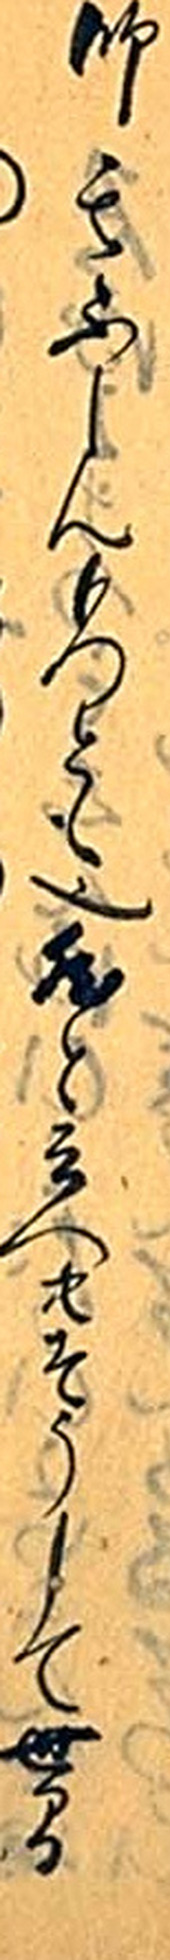師其ふしんもつとも也然と云へ共そうして世間
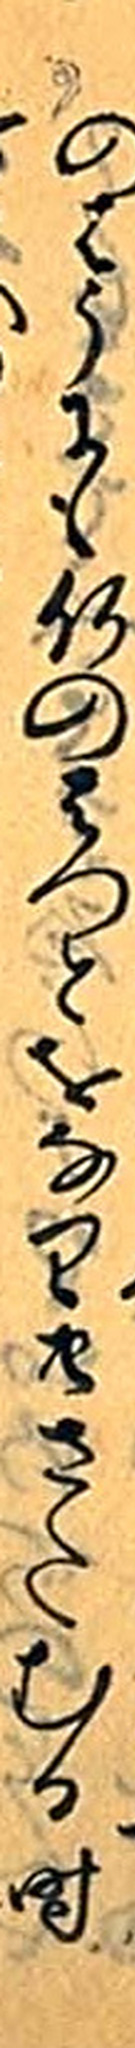のはうにも何のはつとをなり共さたむる時
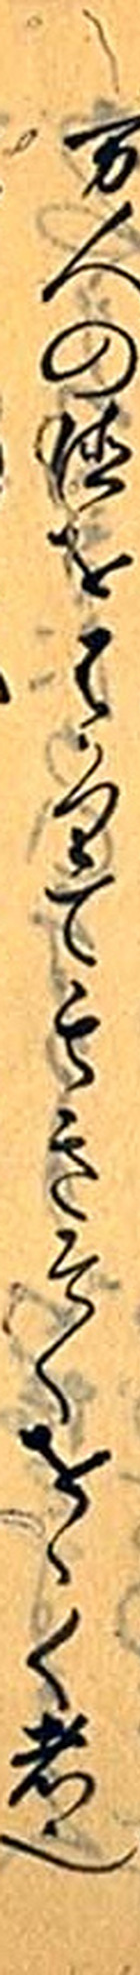万人の徳をはかりて其きそくをゝく者也
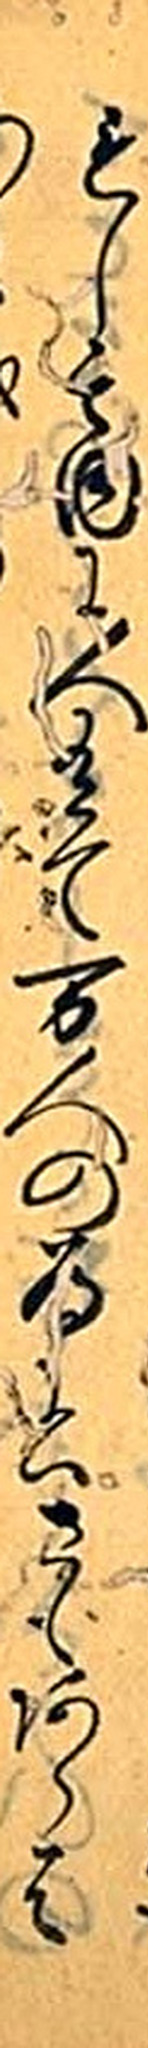もし其内に人有て万人の為にはさもあらは
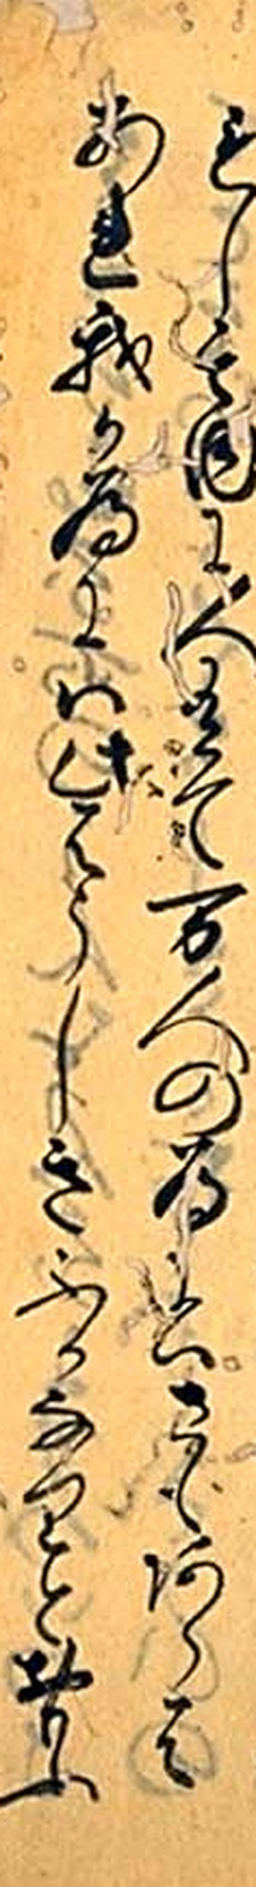あれ我か為には此はうしきふかなりとおもふ
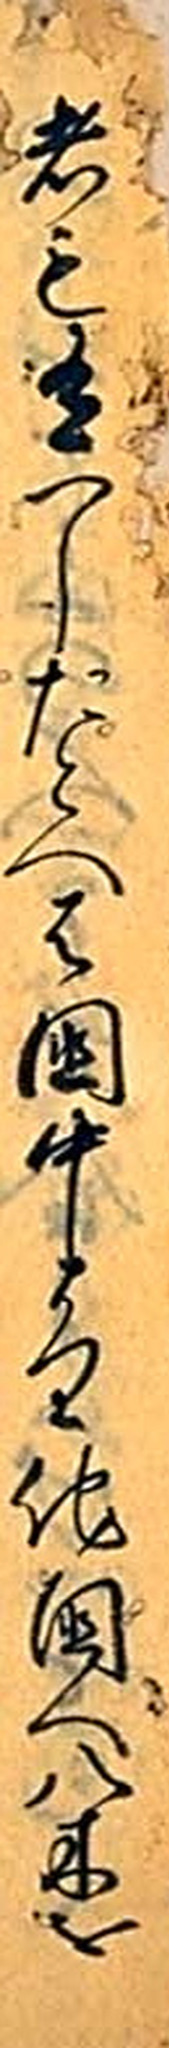者も有へしたとへは国中より他国へ八木を
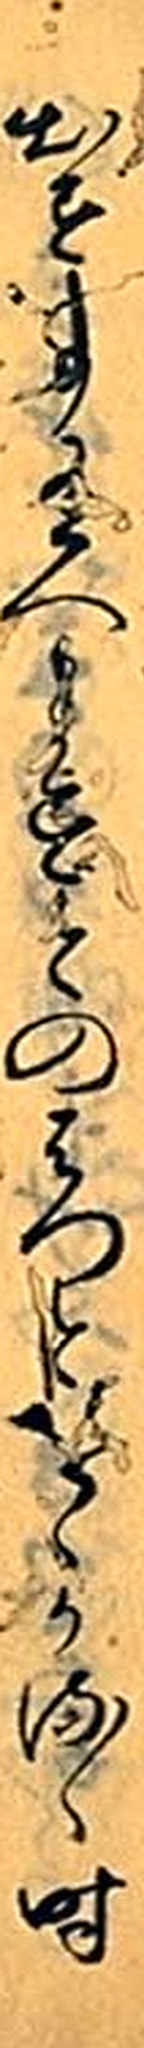出す事有へすとのはつとをゝかるゝ時
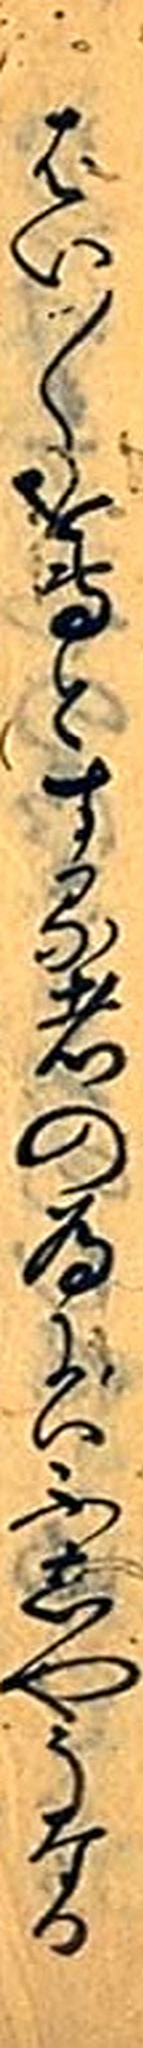はい〳〵を専とする者の為にはふしやうなる
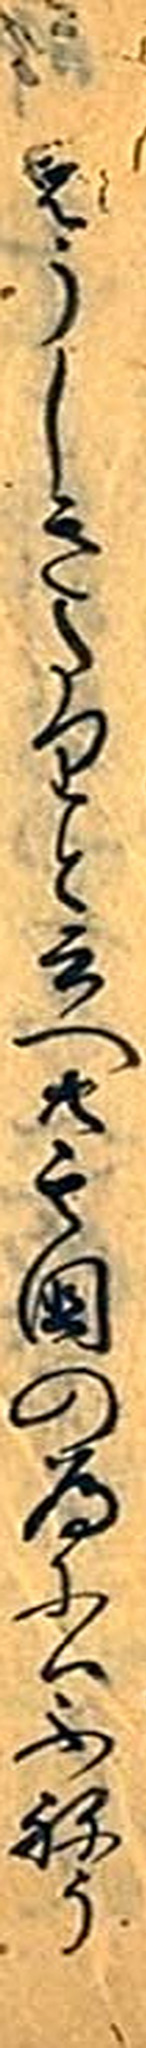はうしきたりと云へ共其国の為にはふねう
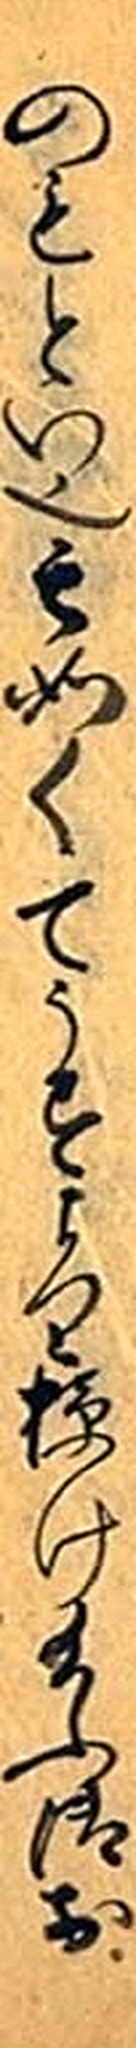のもとい也其如くてうすより授け給ふ御お
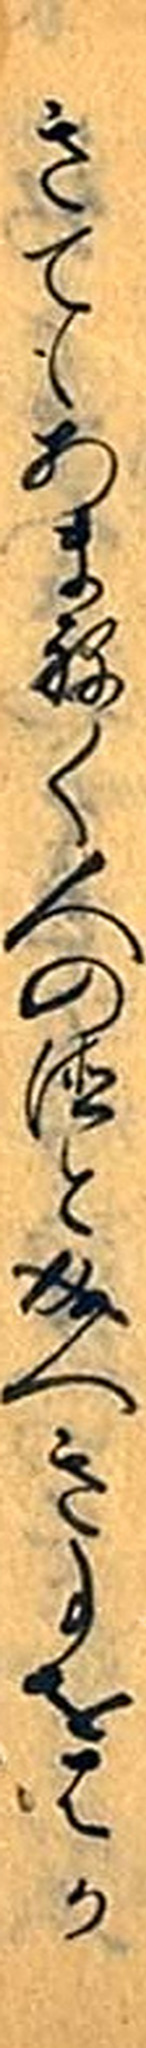きてもあまねく人の徳と成へき事をはか
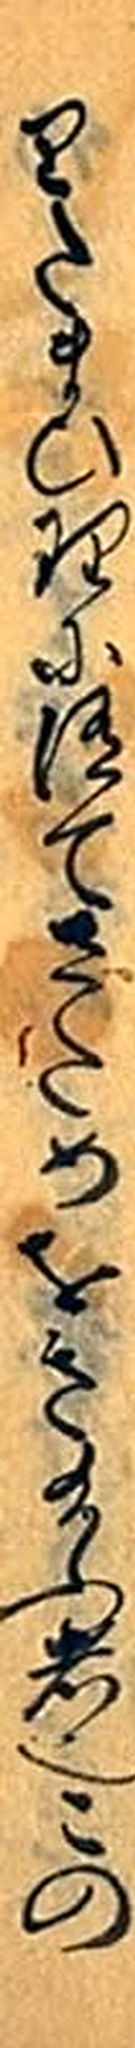りたまひ理に随てさためをき給ふ者也この
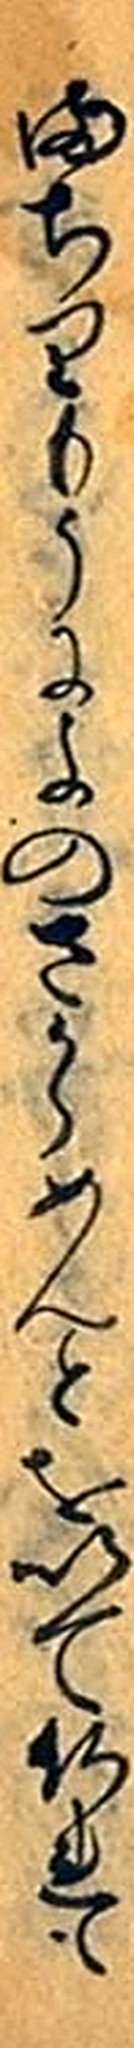まちりもうによのさからめんとを以て何れも
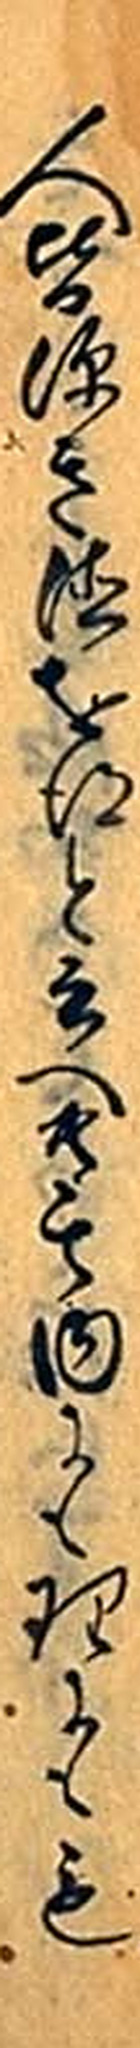人皆深き徳を得と云へ共其内にも理にもも
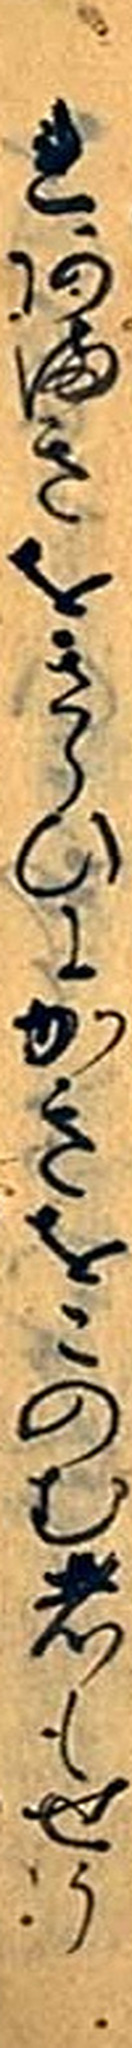れあまきをきらひにかきをこのむ者もせう
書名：ドチリナ・キリシタン
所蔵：東京大学総合図書館 / General Library in the University of Tokyo
